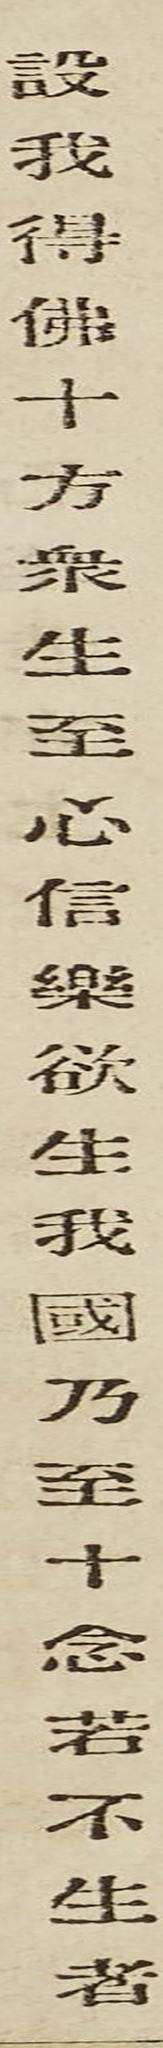設我得仏十方衆生至心信楽欲生我国乃至十念若不生者
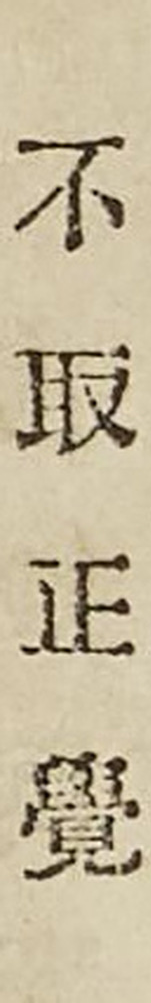不取正覚

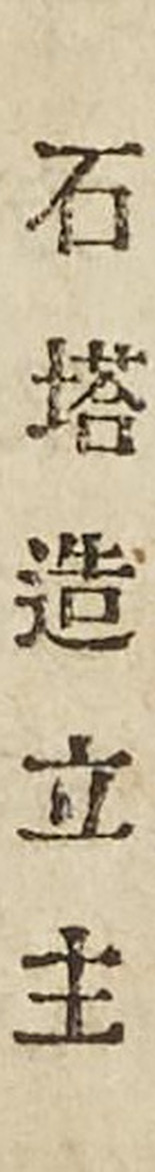石塔造立主
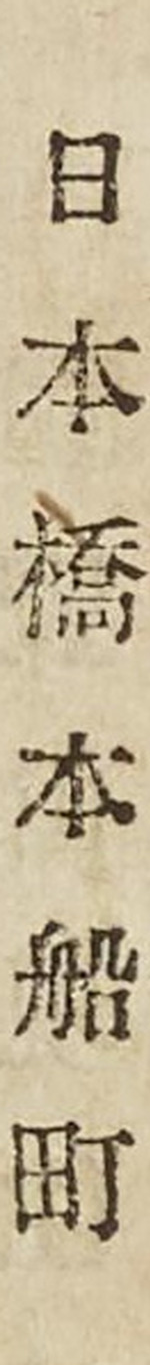日本橋本船町
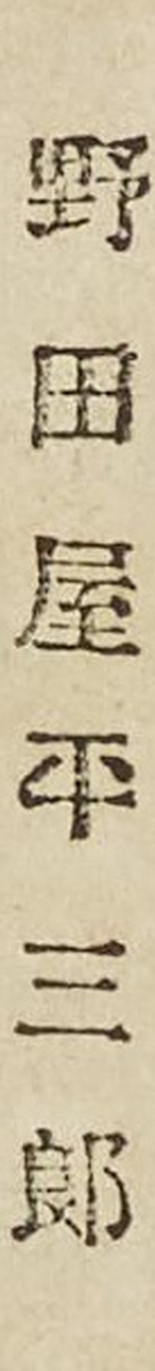野田屋平三郎
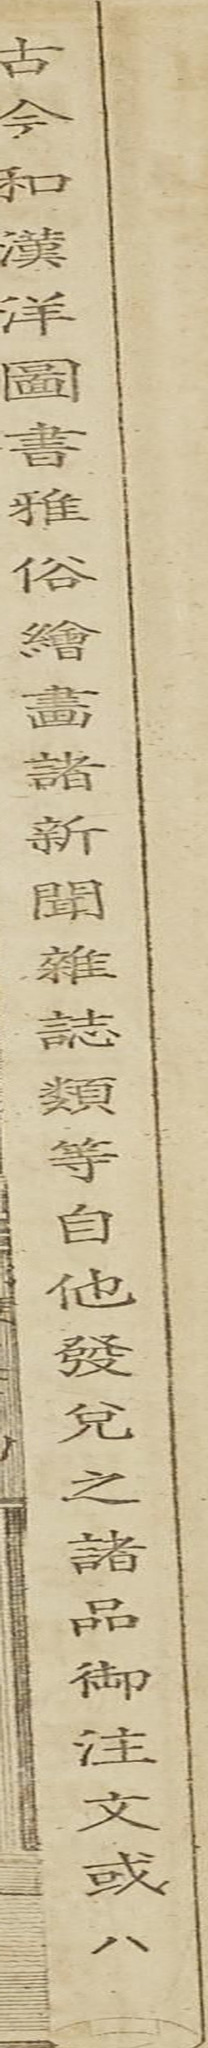古今和漢洋図書雅俗絵画諸新聞雑誌類等自他発兌之諸品御注文或は
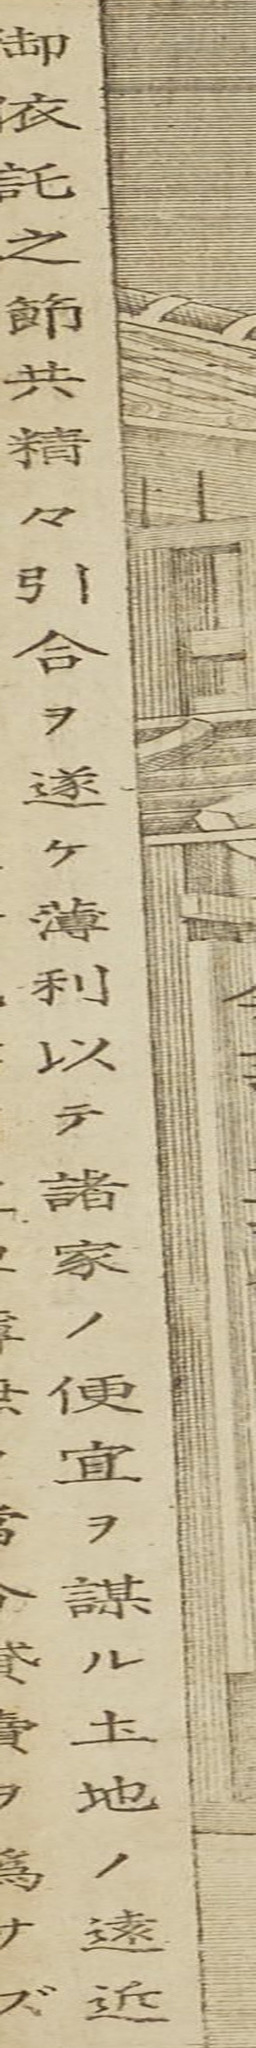御依託之節共精々引合ヲ遂ケ薄利以テ諸家ノ便宜ヲ謀ル土地ノ遠近
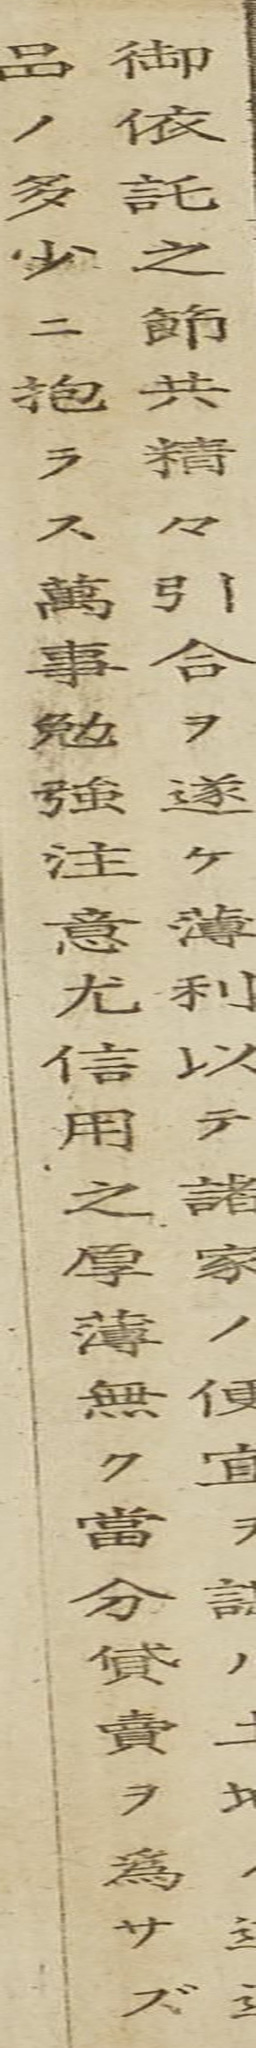品ノ多少ニ抱ラス万事勉強注意尤信用之厚薄ク当分貸売ヲ為サズ

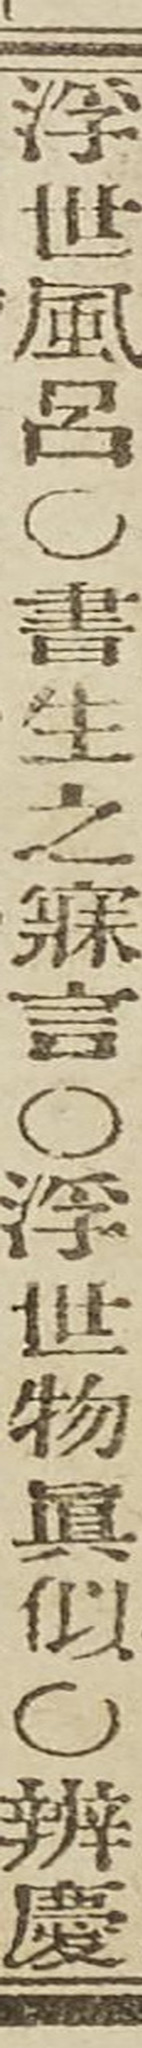浮世風呂○書生之寝言○浮世物真似○弁慶
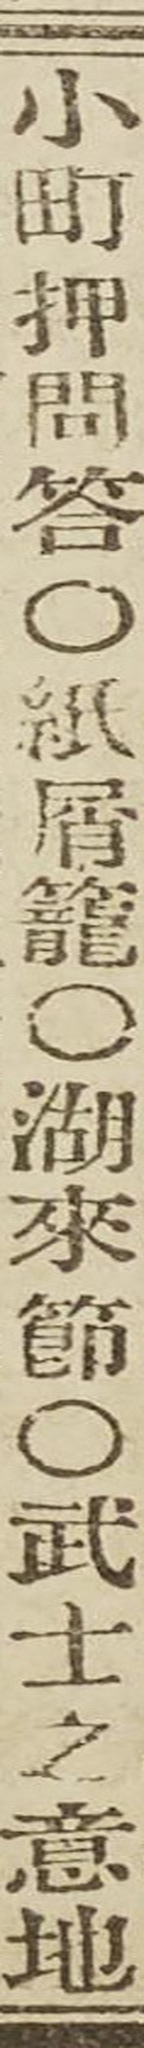小町押問答○紙屑籠○潮来節○武士之意地
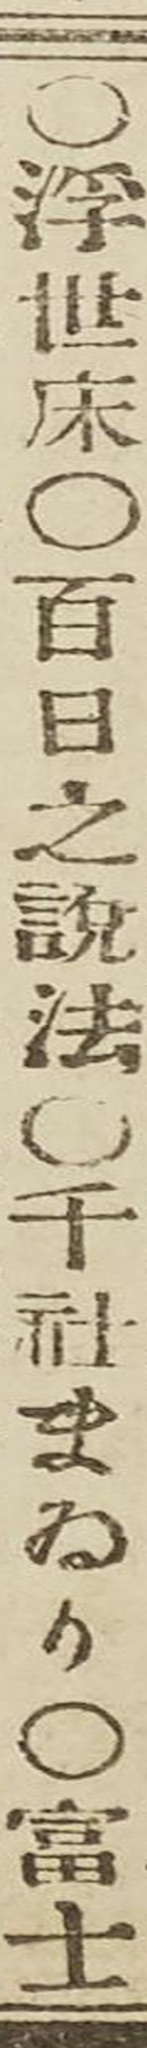○浮世床○百日之説法○千社まゐり○富士
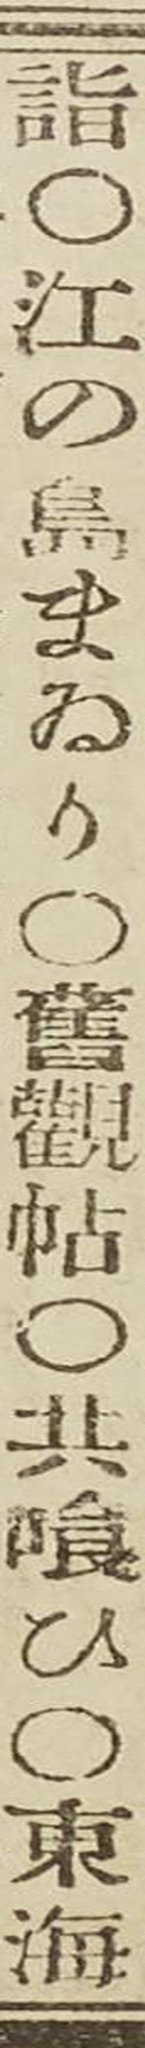詣○江の島まゐり○旧観帖○共喰ひ○東海
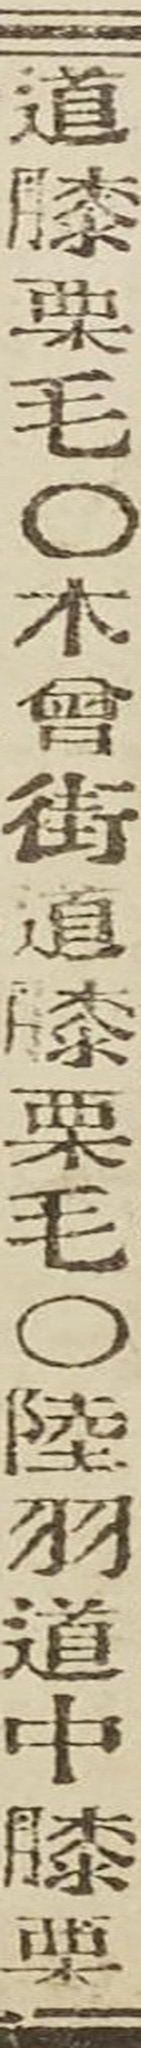道膝栗毛○木曽街道膝栗毛○陸羽道中膝栗
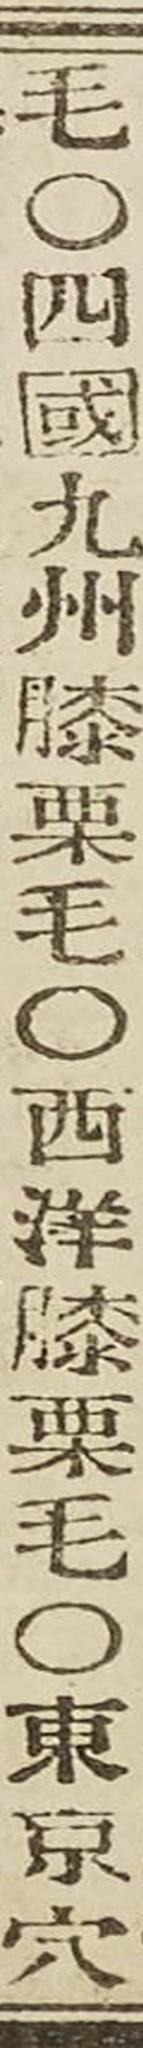毛○四国九州膝栗毛○西洋膝栗毛○東京穴
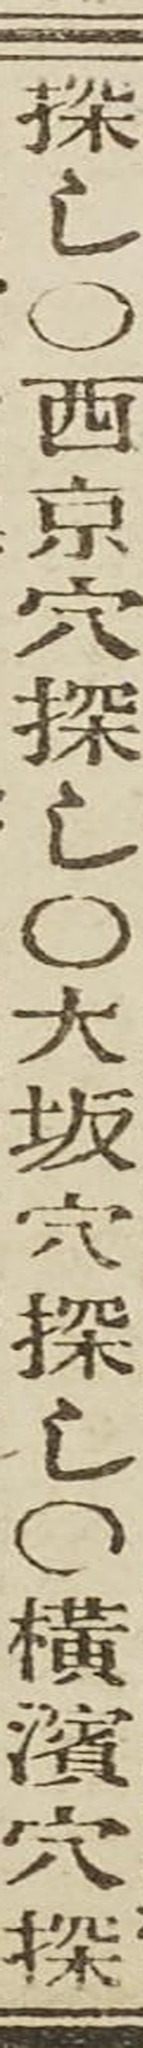探し○西京穴探し○大坂穴探し○横浜穴探
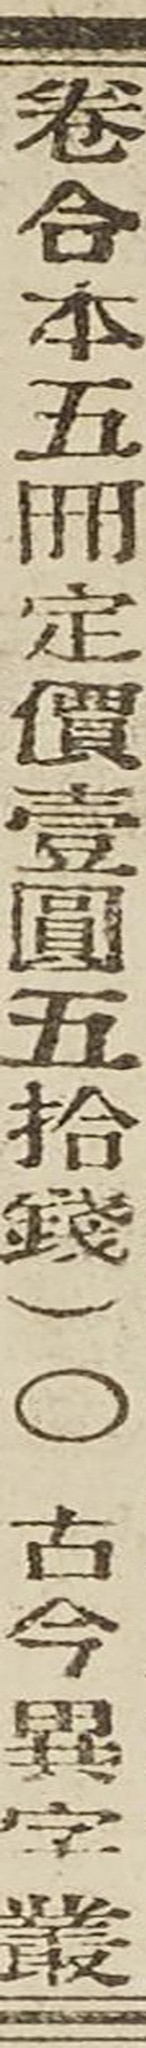巻合本五冊定価壹円五十銭）○古今異字叢
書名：永代惨話　文化の夢　全
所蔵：東京大学地震研究所図書室 Earthquake Research Institute Library, The University of Tokyo, JAPAN
